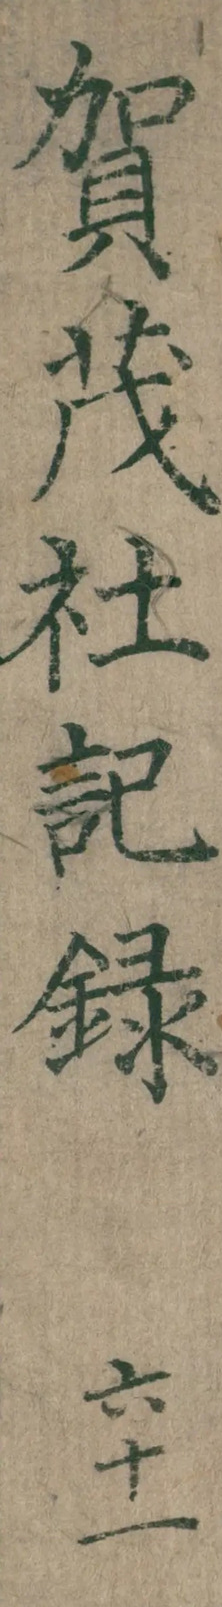賀茂社記録六十一

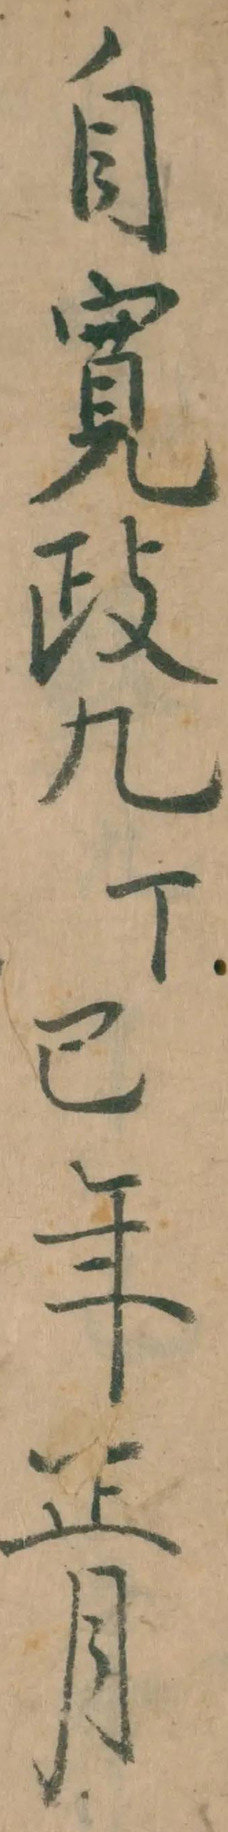自寛政九丁巳年正月
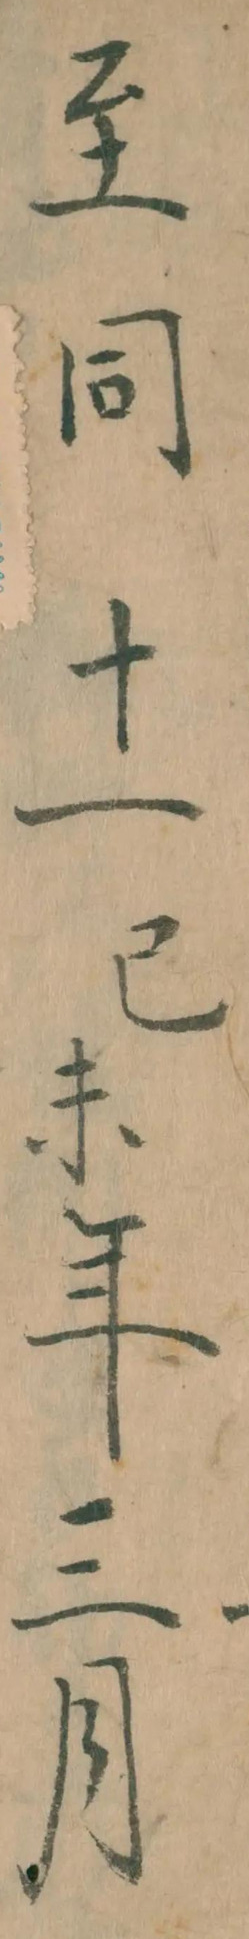至同十一己未年三月
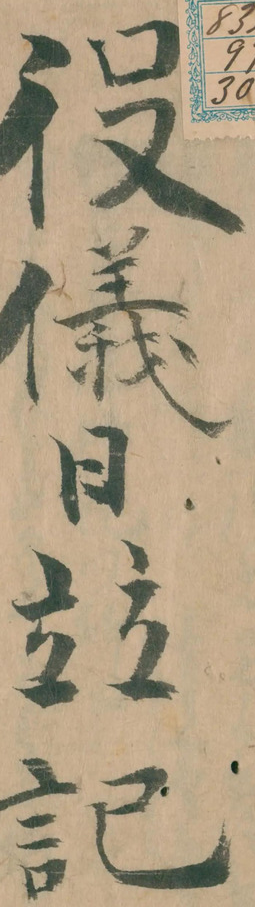役儀日並記
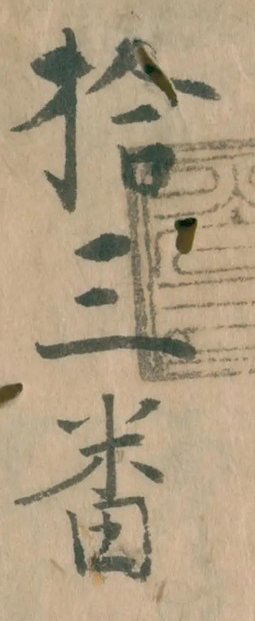拾三番

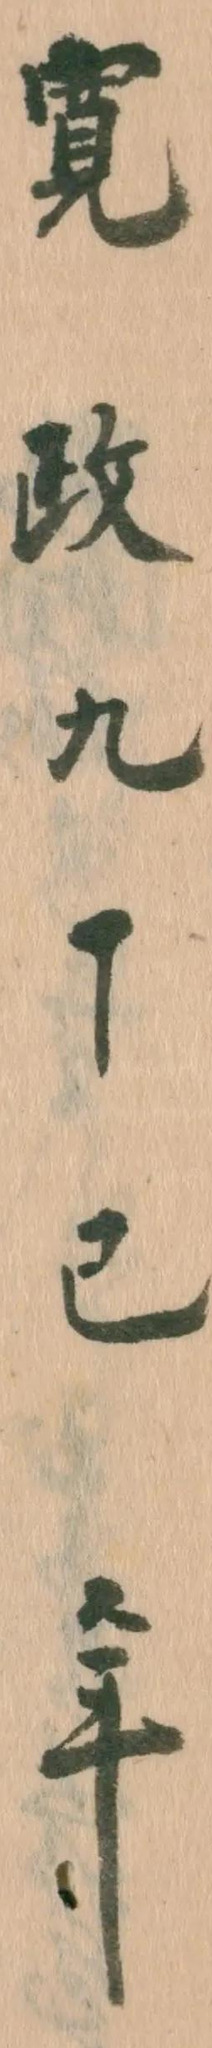寛政九丁巳年
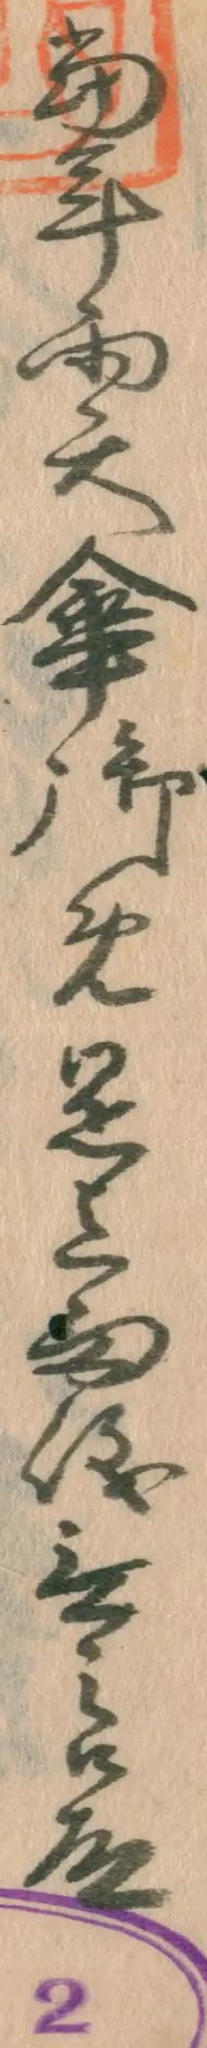当年雨天傘御免是迄雨儀無之候故
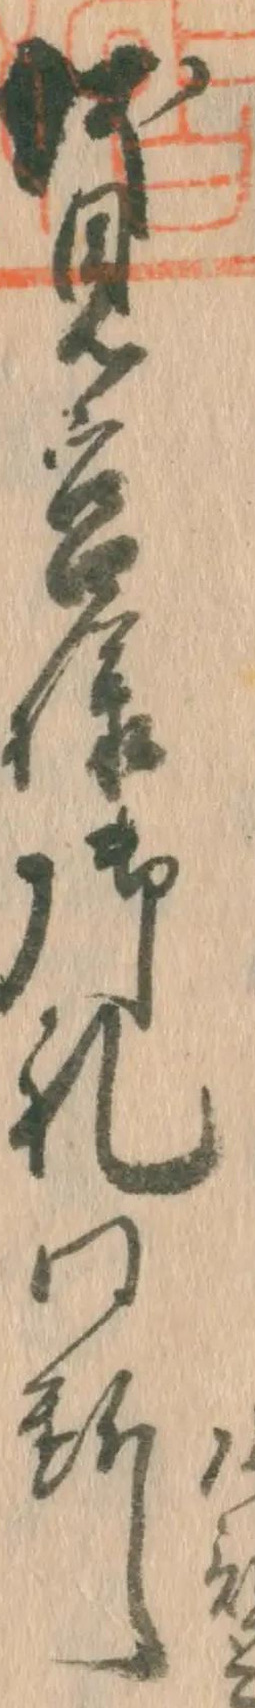伏見宮様御礼同断
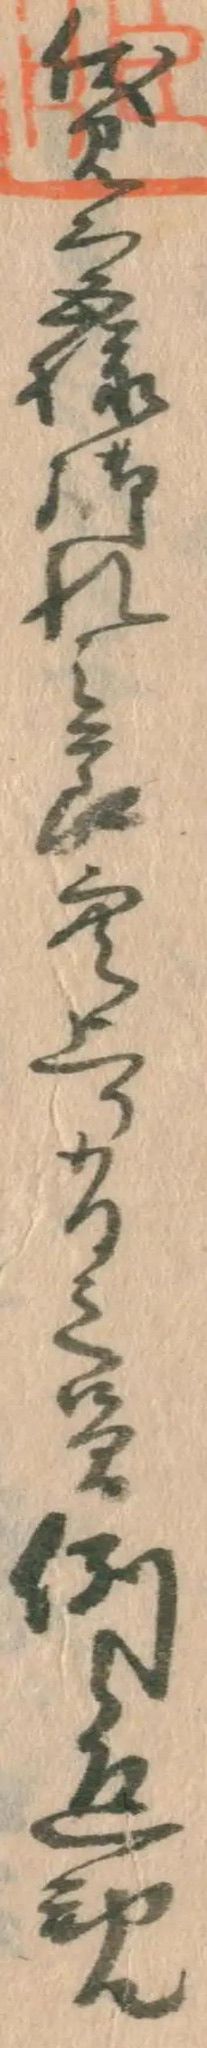伏見宮様御礼之節空上り有之候間例之通勤ル
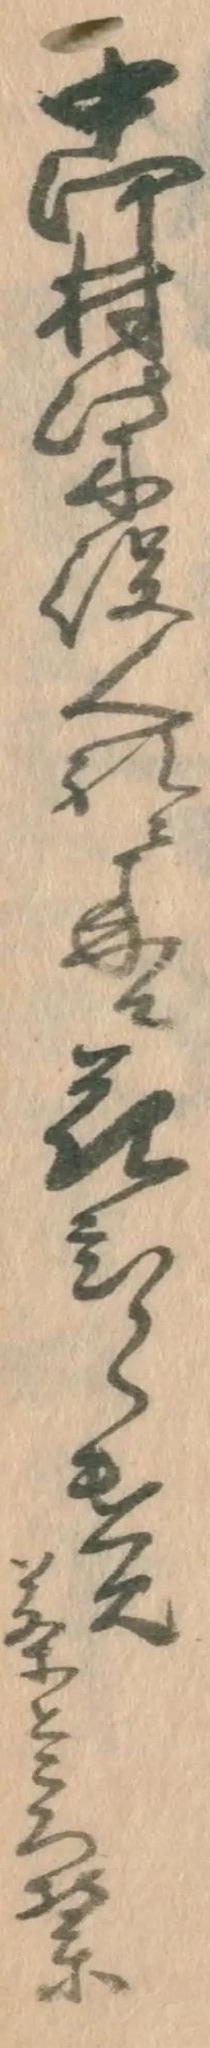中村柴役人礼ニ来ル花ひら遣ス茶ところ持参

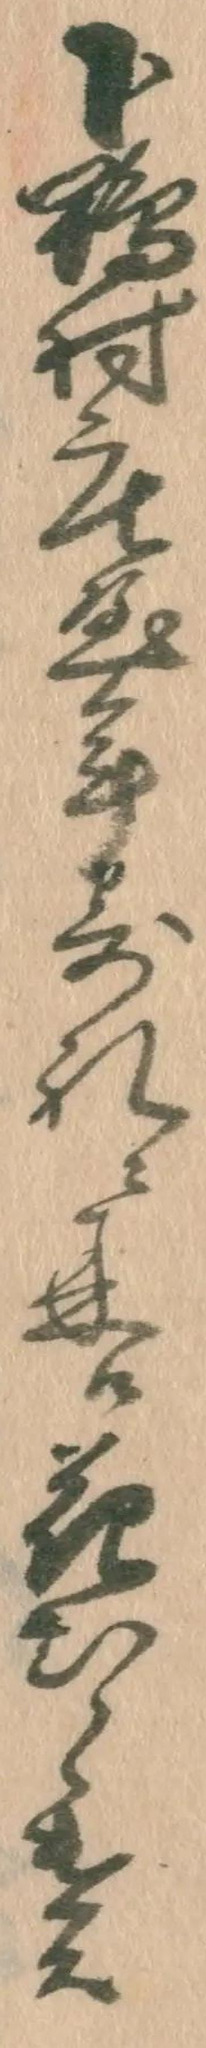六日下鴨村庄屋年寄礼ニ来ル花ひら遣ス
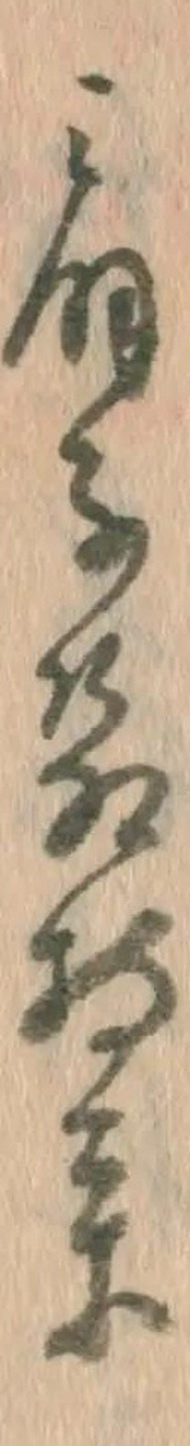扇子箱持参
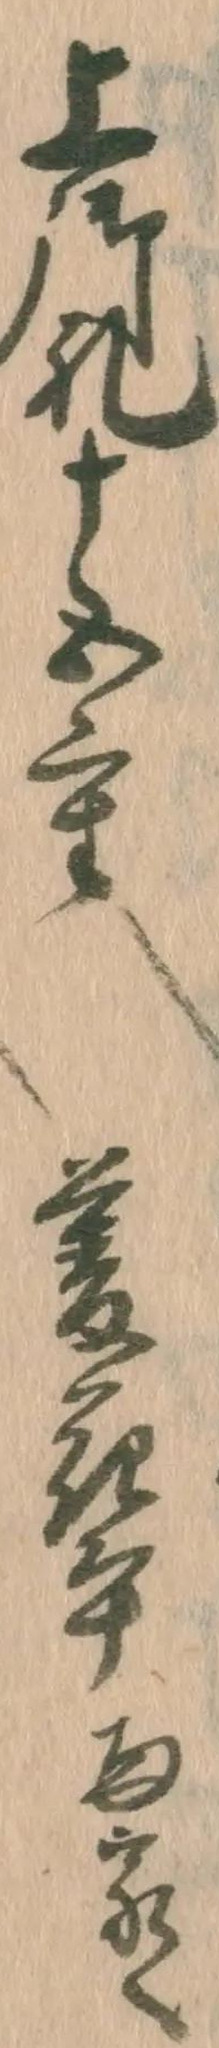上御礼十五重菱花平両家へ
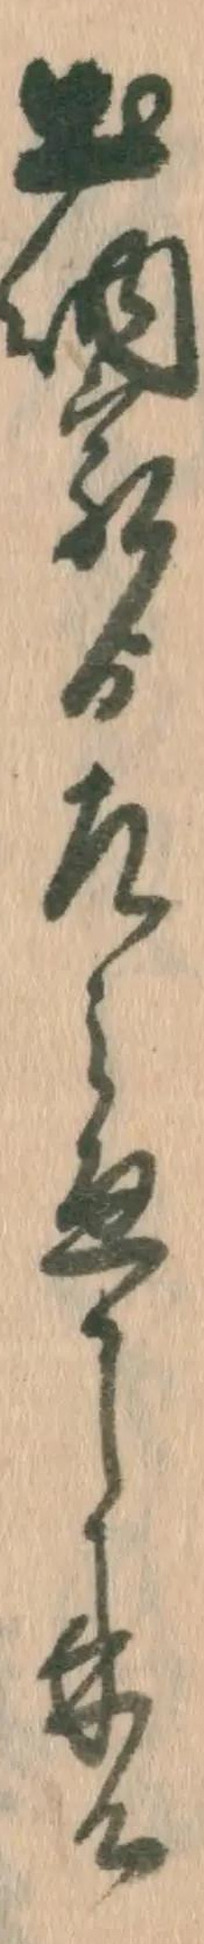出納家ゟ左之通申来ル
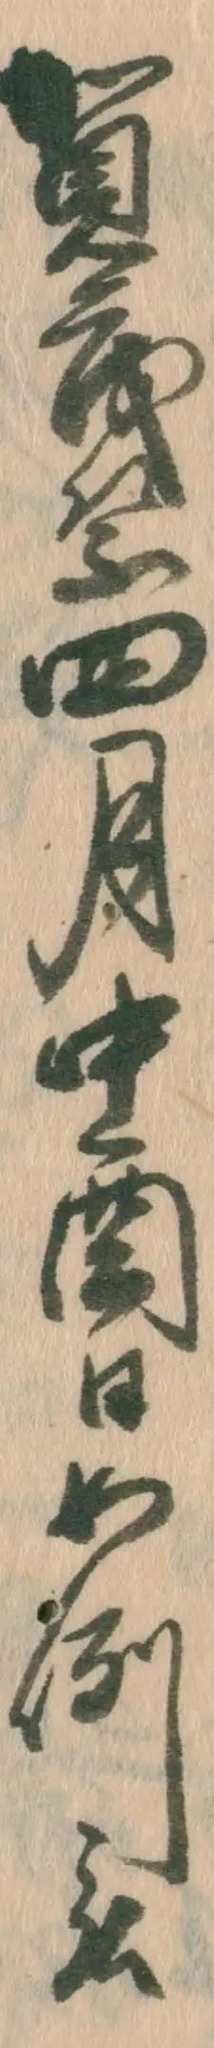賀茂祭四月中酉日如例被
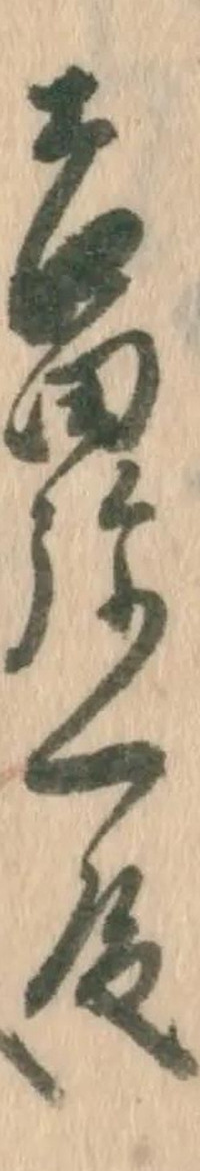吉田弥一殿
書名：賀茂社記録. 第61冊
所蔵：国立国会図書館 National Diet Library, JAPAN
